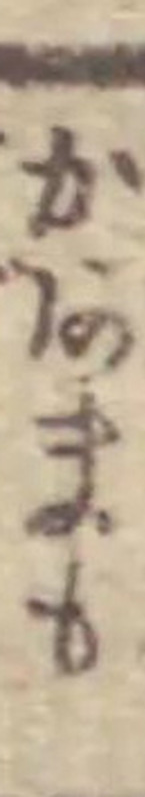があまも
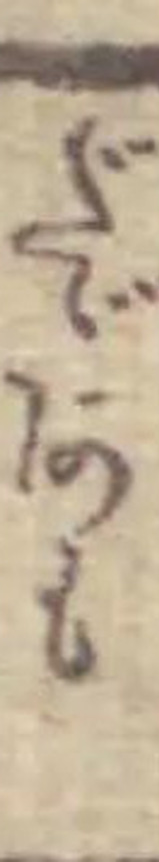だゝあも

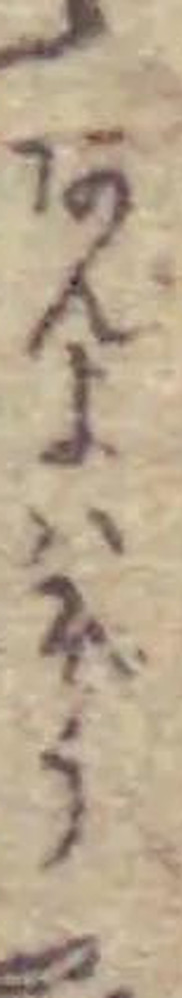あんよはぞう
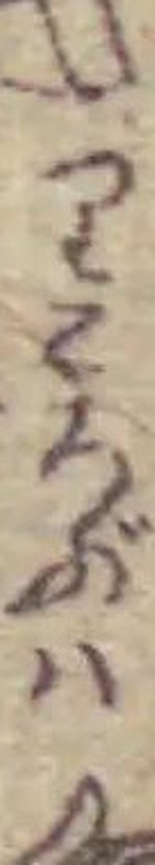りころぶは
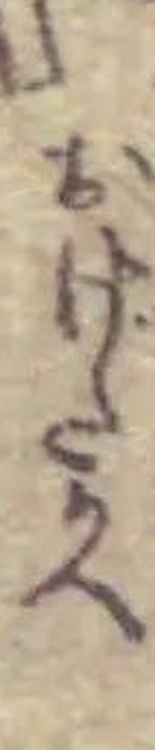おげたかへ
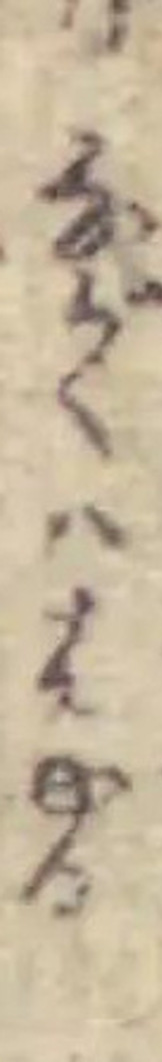ながくははやる
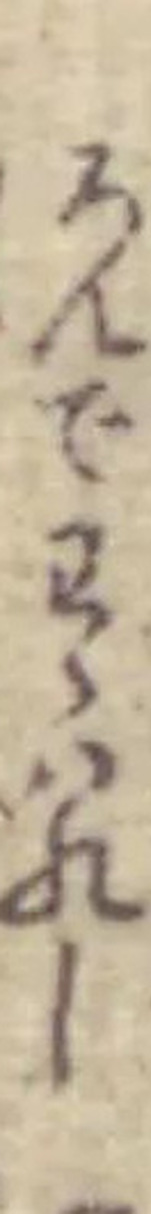ろんでわらはれし
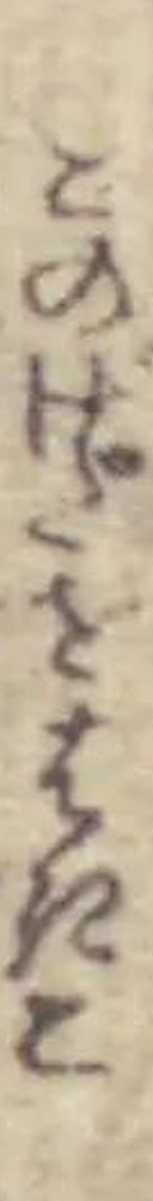このげたをはきこ
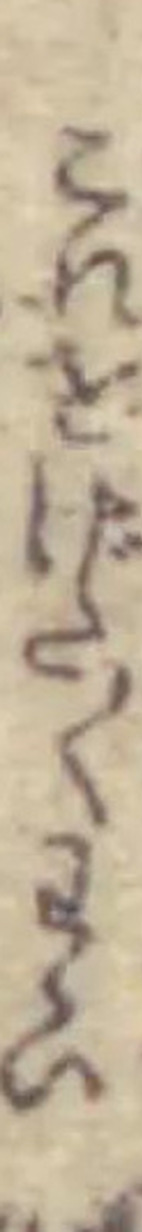これをげた〳〵わらい
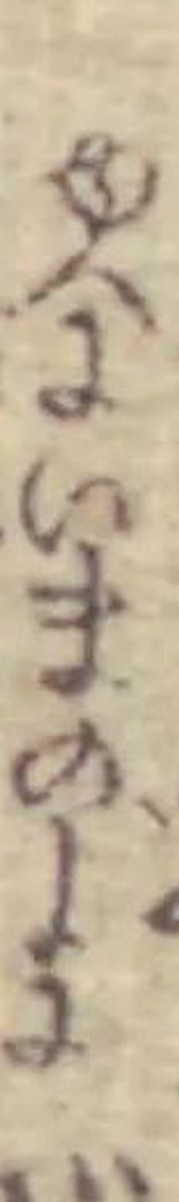ゆへにいまのよに
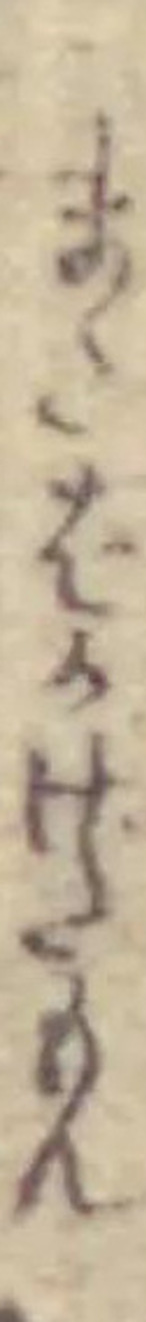またばかげたもん
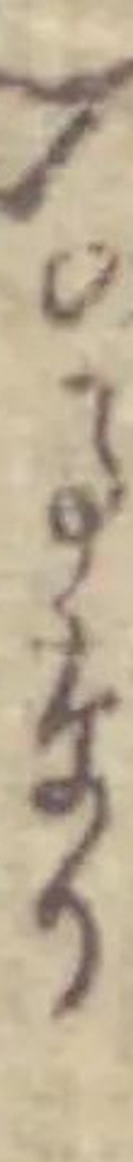の事なり
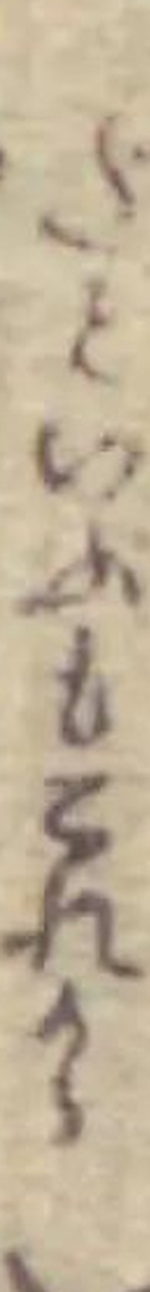だといふもこれから
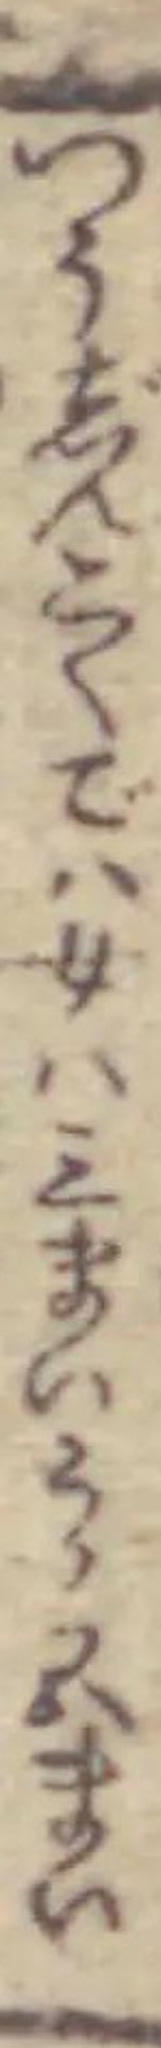つう人こゝでは女は三まいうら五まい
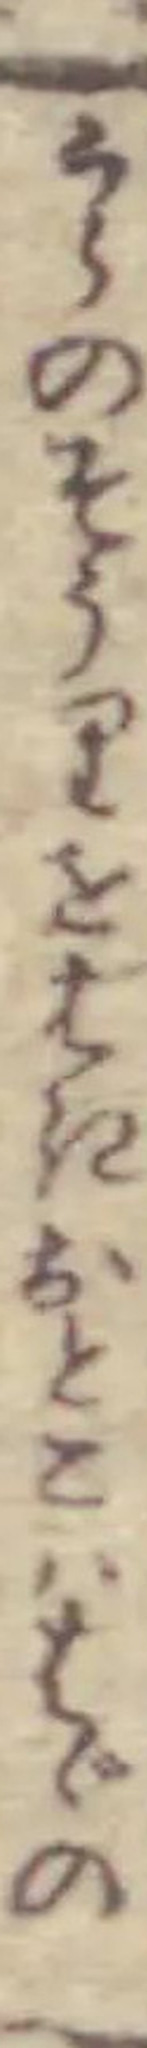うらのそうりをはきおとこははゞの
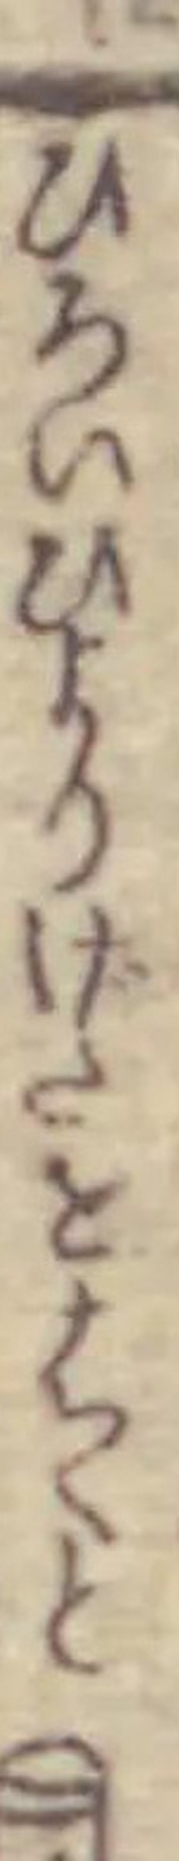ひろいひよりげたをはくと
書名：茶羅毛通人 3巻
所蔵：国立国会図書館 National Diet Library, JAPAN
